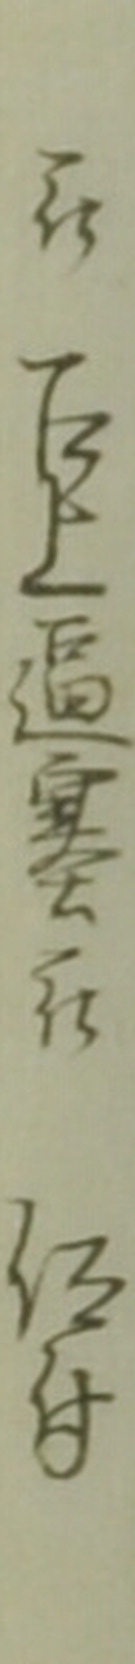被召上逼塞被仰付

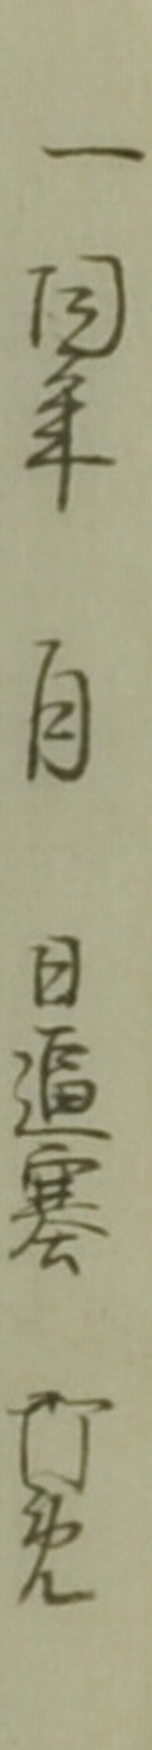一同年月日逼塞御免
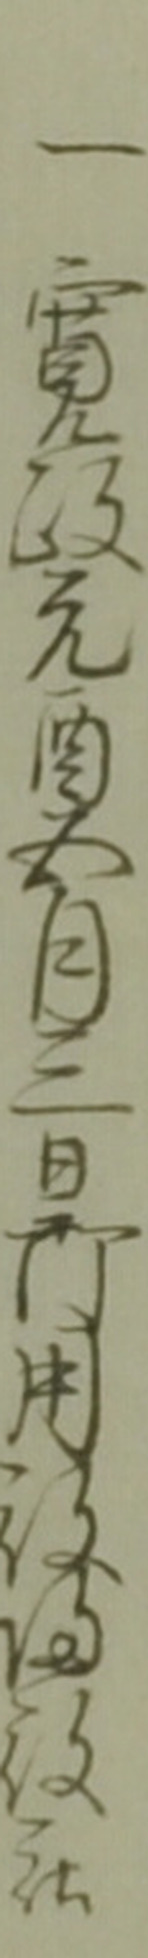一寛政元酉正月二日御用役帰役被
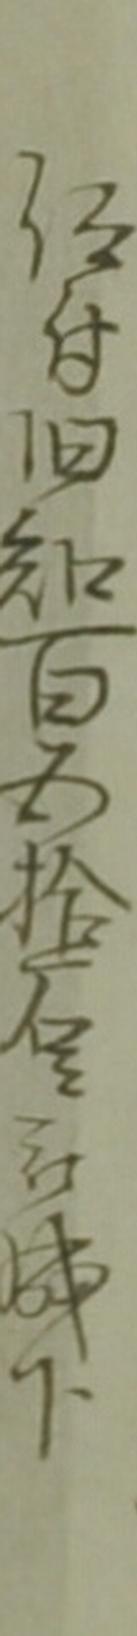仰付旧知百五拾石ニ被成下
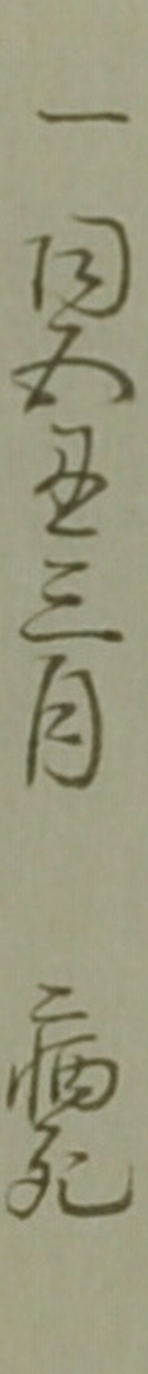一同五丑三月病死
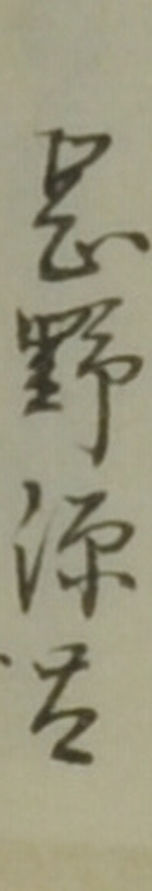岡野源太
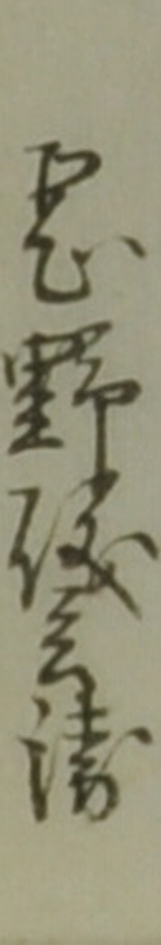岡野儀兵衛
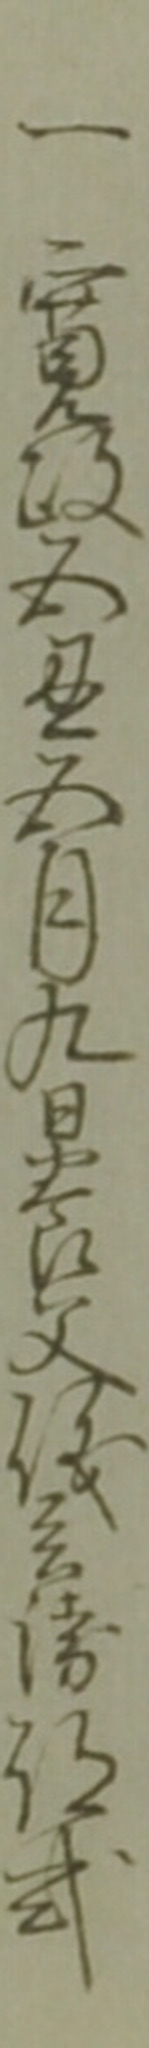一寛政五丑五月九日養父儀兵衛役式
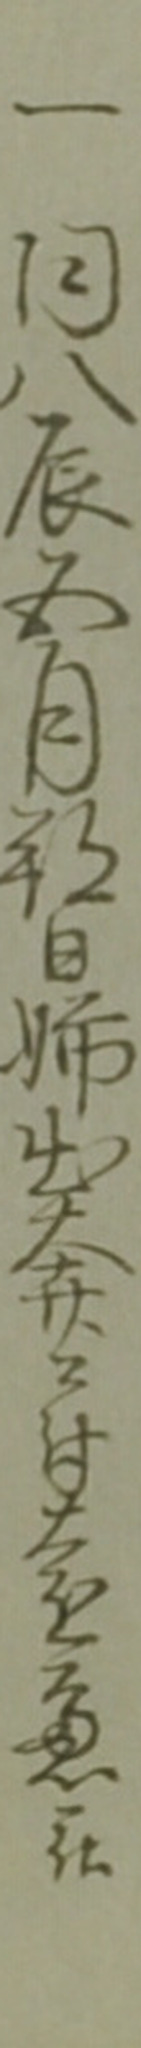一同八辰五月朔日姉出発にニ付遠慮被
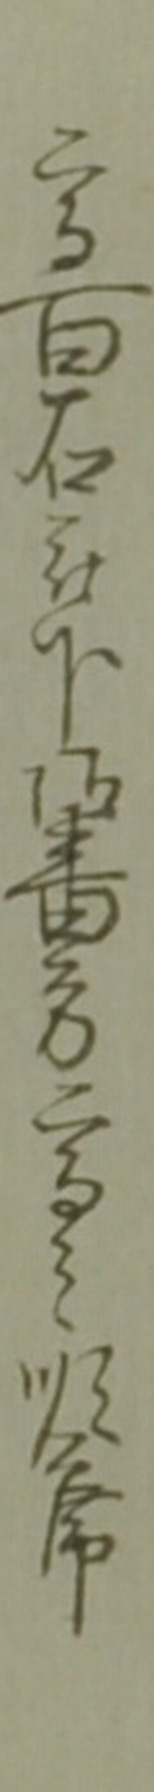高百石被下御番方高之順席
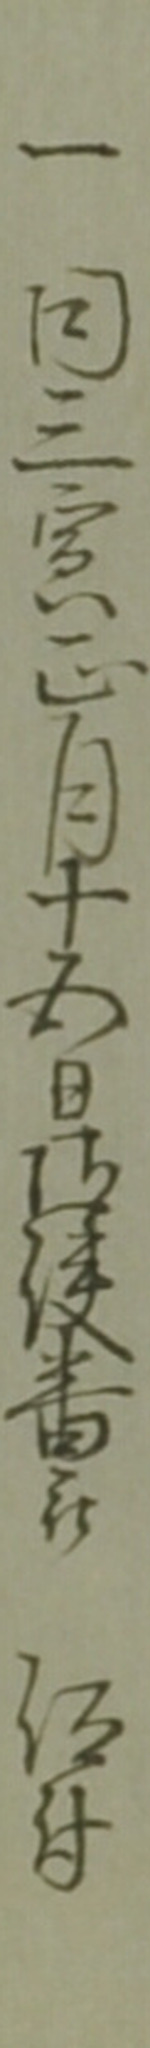一同三寅正月十五日御使番被仰付
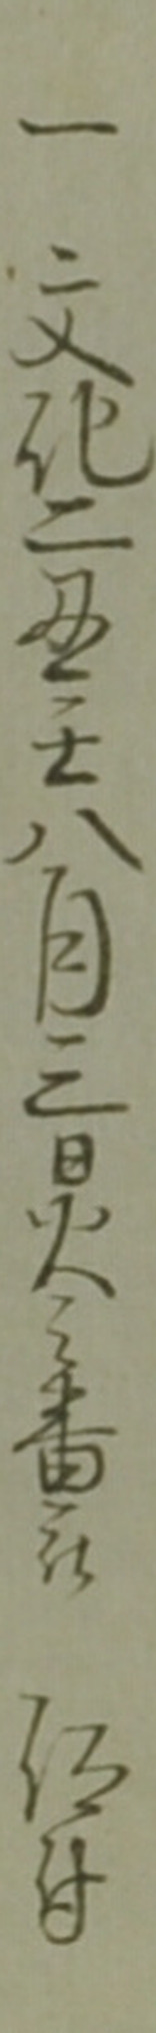一文化二丑壬八月三日火之番被仰付
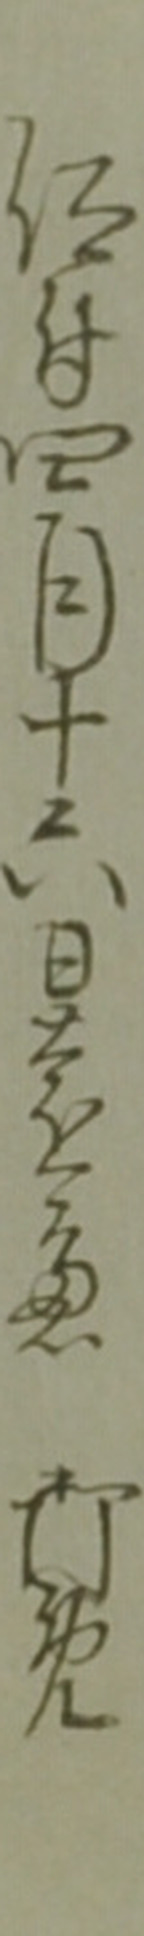仰付四月十六日遠慮御免
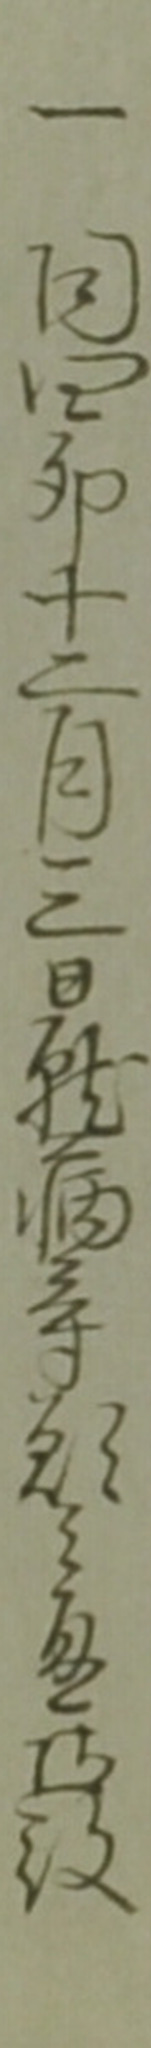一同四卯十二月三日就病気願之通御役
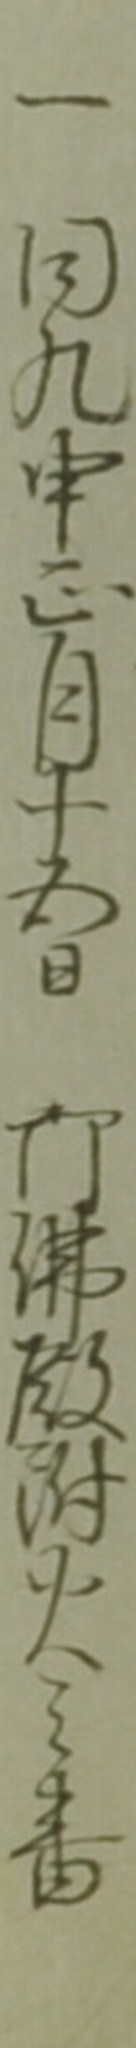一同九申正月十五日御仏殿附火之番
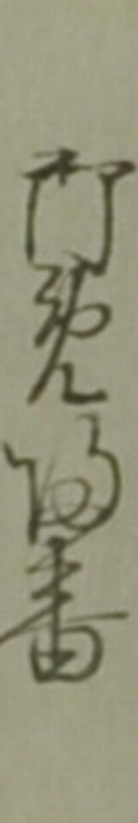御免帰番
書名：給人諸士勤仕録（三）
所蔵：伊那市立高遠町図書館・合同会社AMANE
